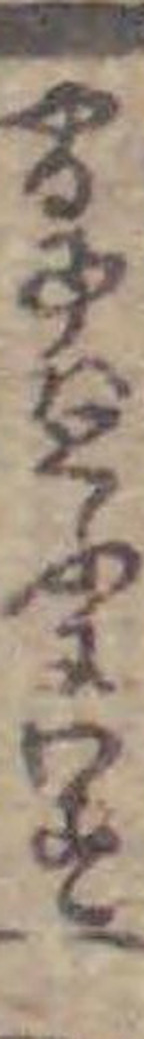やる事はとふにわす
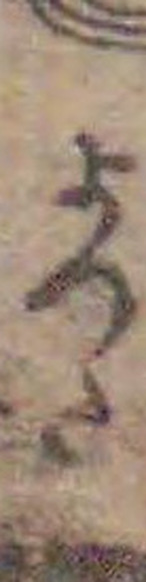よつた
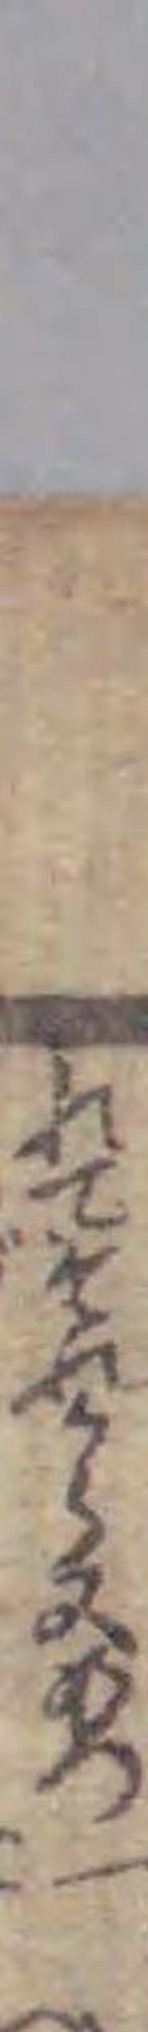れてそれから又あつ
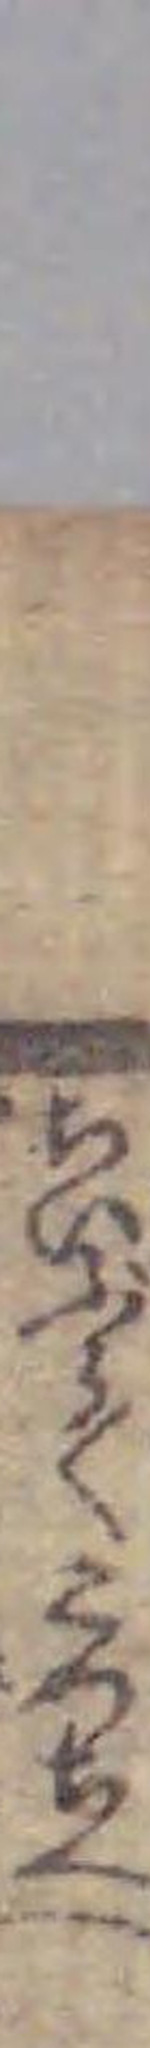ちいぶら〳〵こつちへ
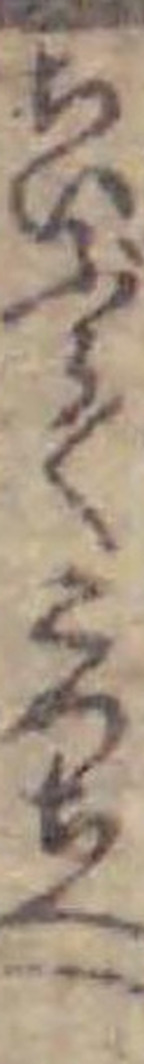ちいぶら〳〵こつちへ
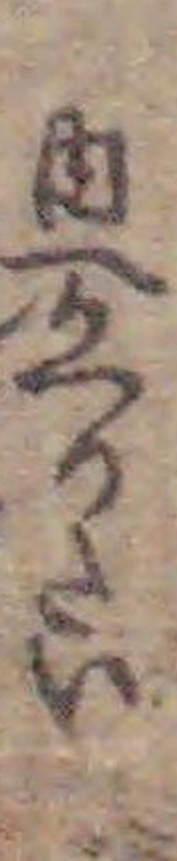内へかへりたい
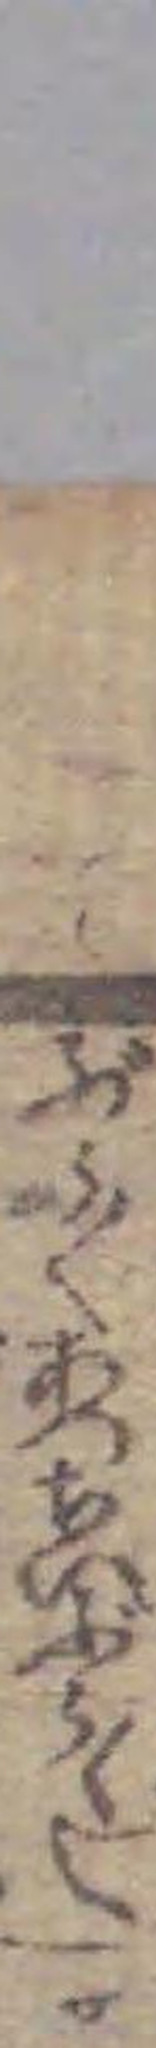ぶら〳〵あつちいぶら〳〵
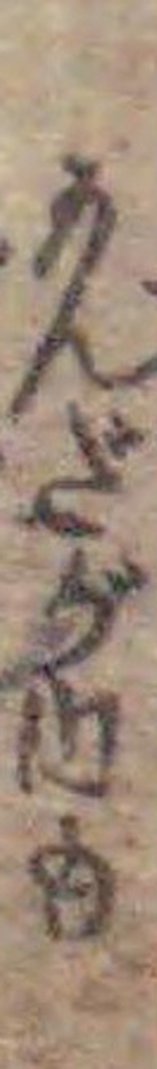もんだが内も
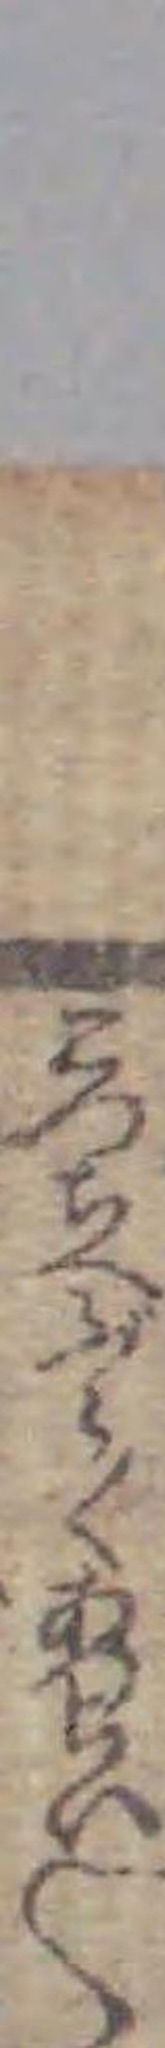こつちへぶら〳〵あつちい
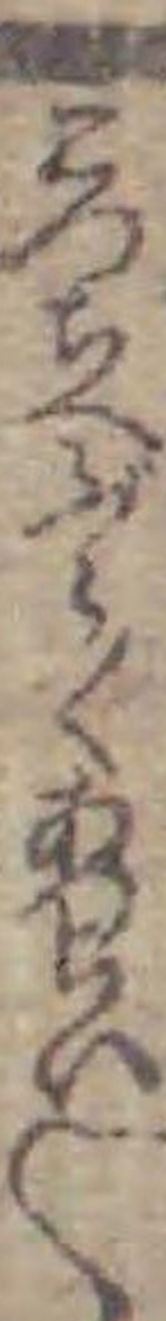こつちへぶら〳〵あつちい
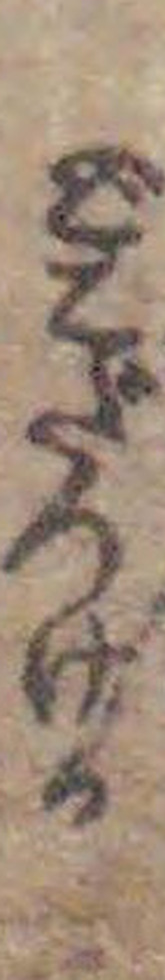どこだつけか
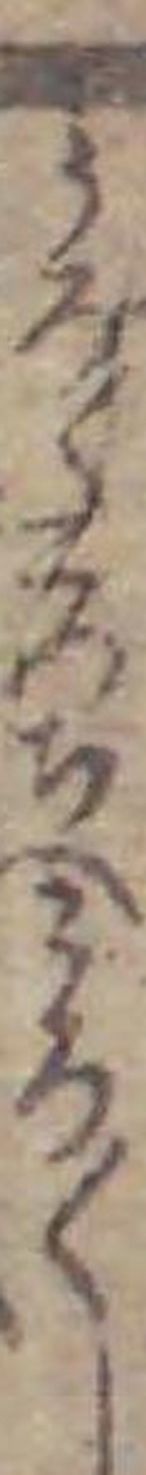うろ〳〵こつちへうろ〳〵
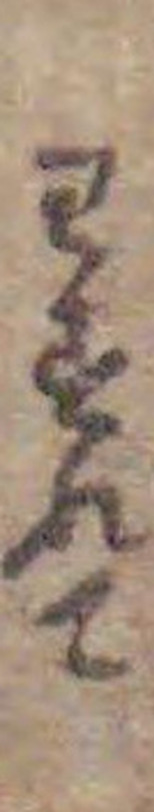わすれて
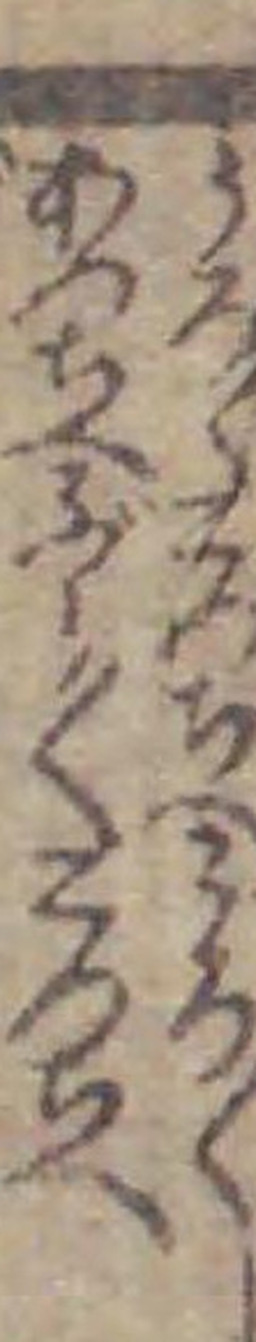あつちへぶら〳〵こつちへ
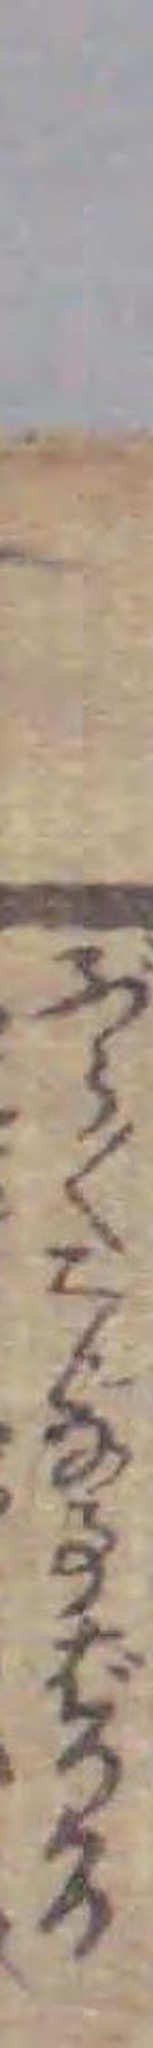ぶら〳〵こんな事ばつかり
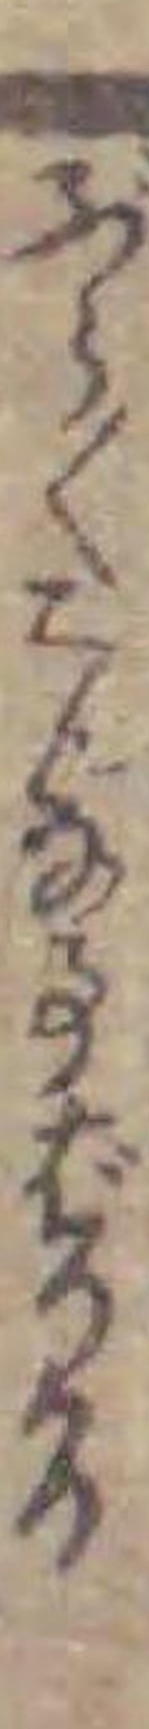ぶら〳〵こんな事ばつかり
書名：年寄之冷水曽我 : 3巻
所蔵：国立国会図書館 National Diet Library, JAPAN
